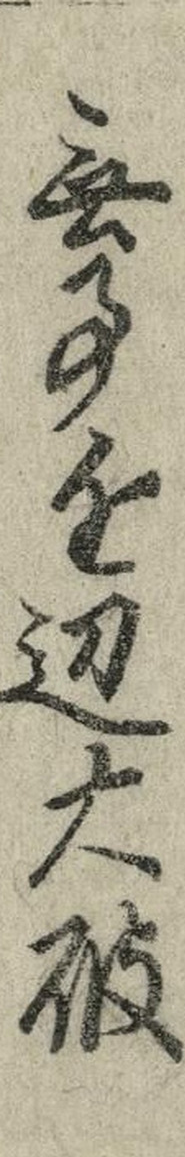無事近辺大破
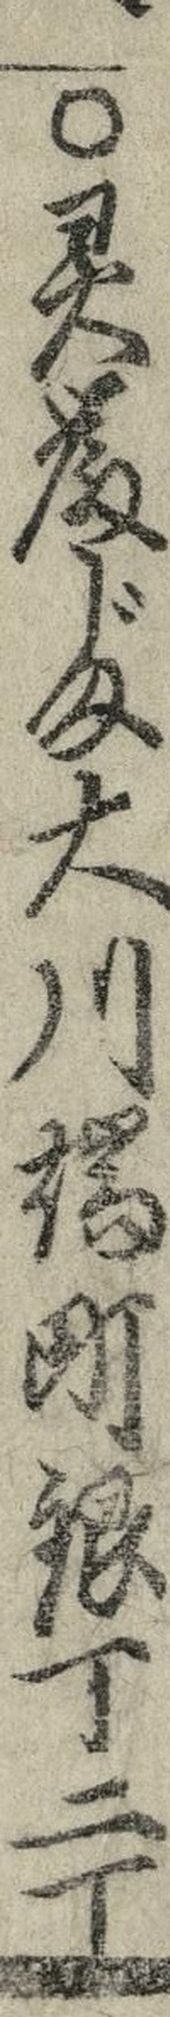○霊厳じま大川端町銀丁二丁
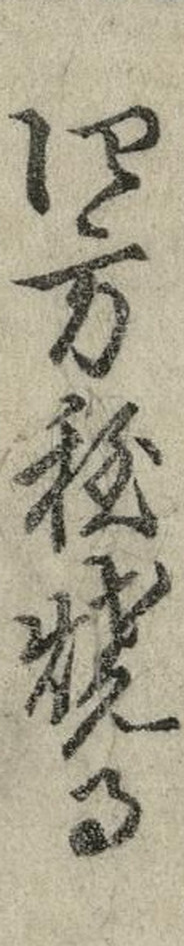四方程焼る
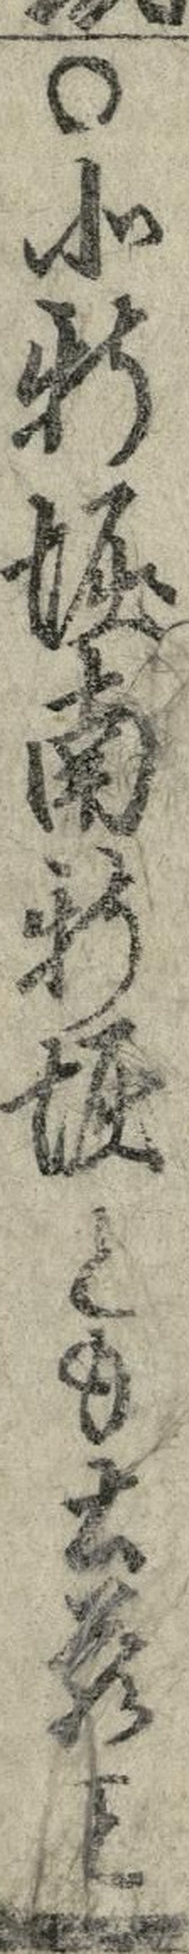○北新堀南新堀とも土蔵こと
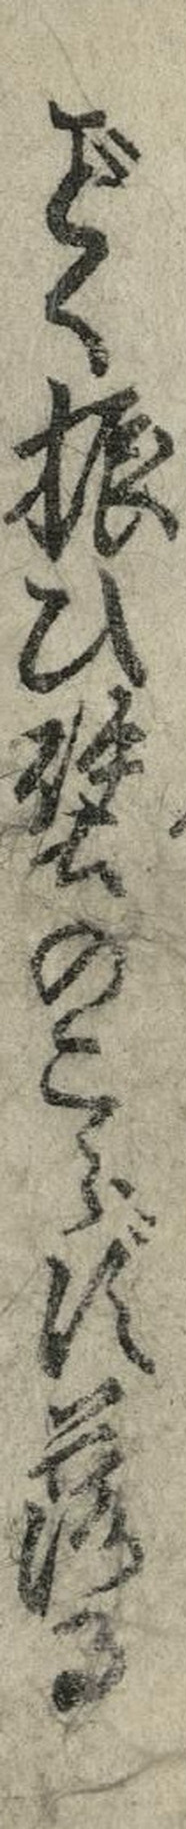ごとく振ひ壁のこらず落る

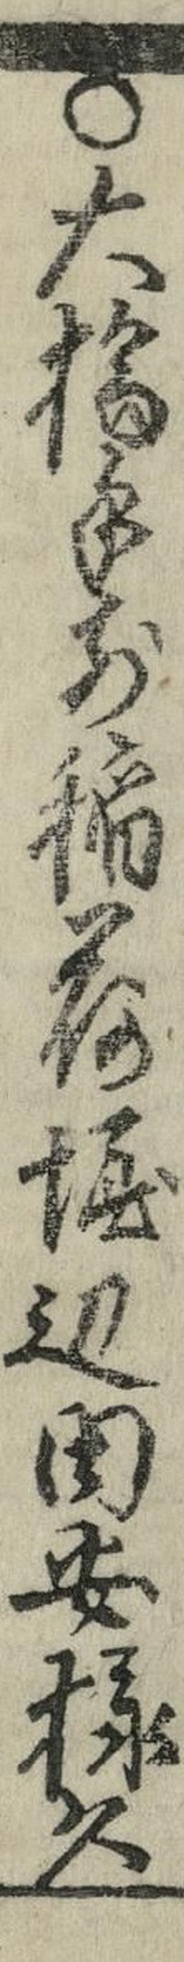○大橋手前稲荷堀辺田安様久
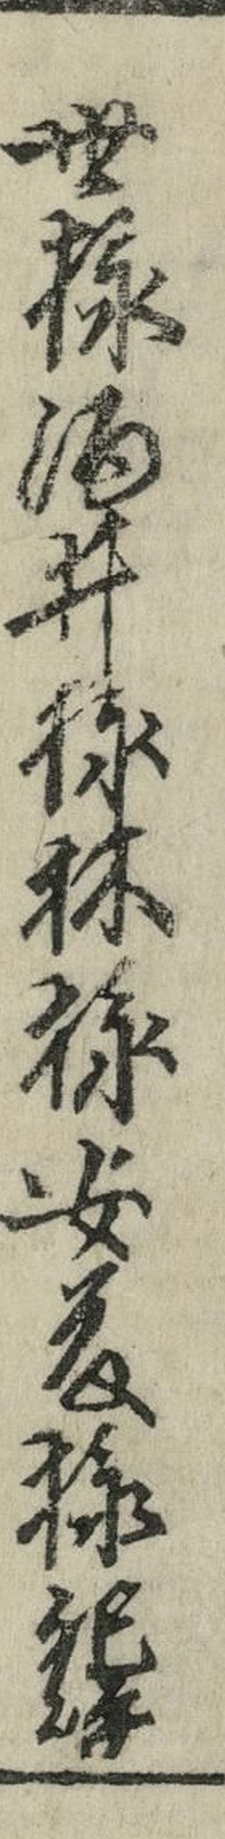世様酒井様林様安藤様紀伊
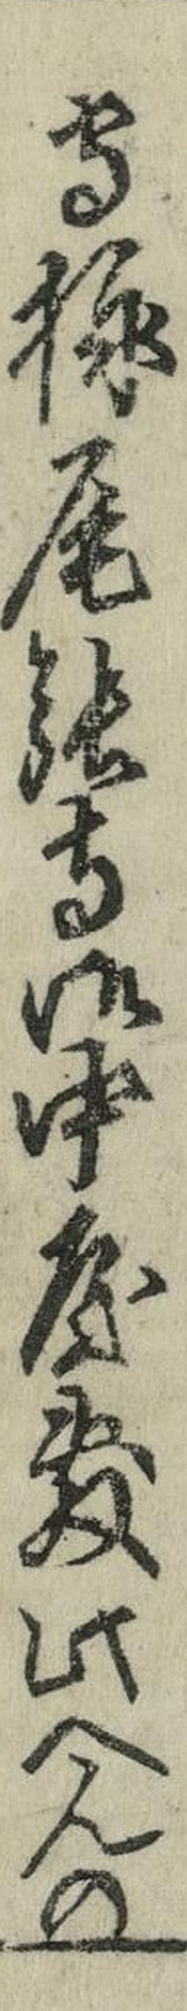守様尾張守御中屋敷此へんの
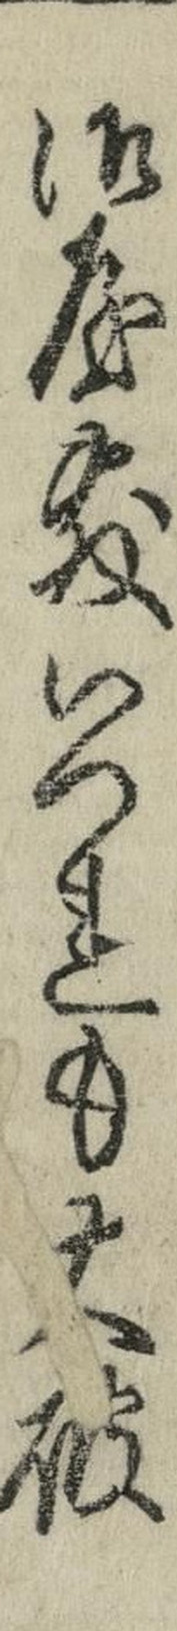御屋敷いつれも大破
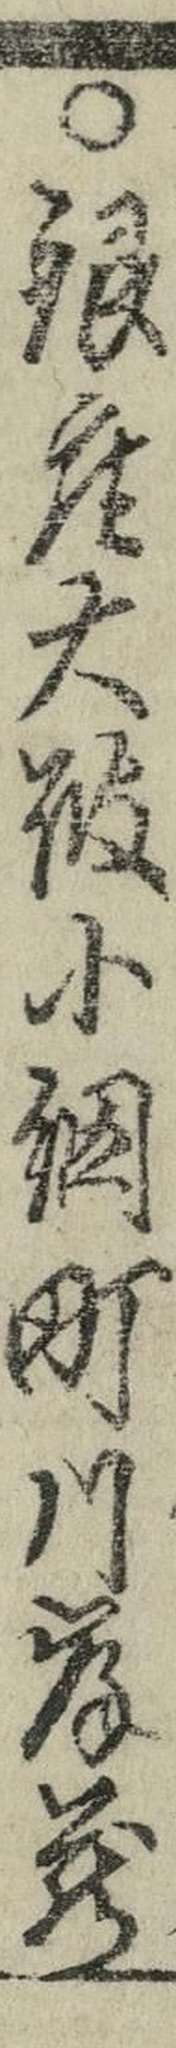○銀座大破小網町川岸蔵
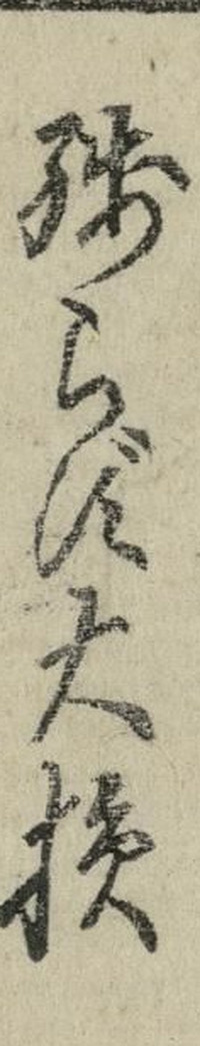残らず大損
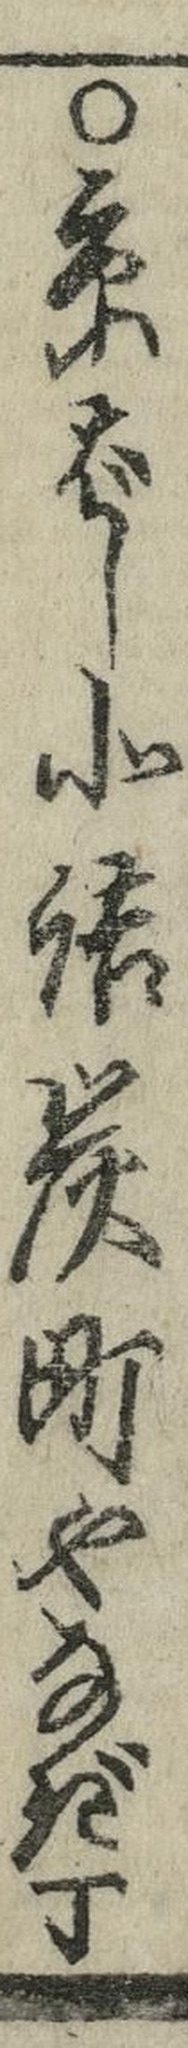○京ばし北詰炭町やなぎ丁
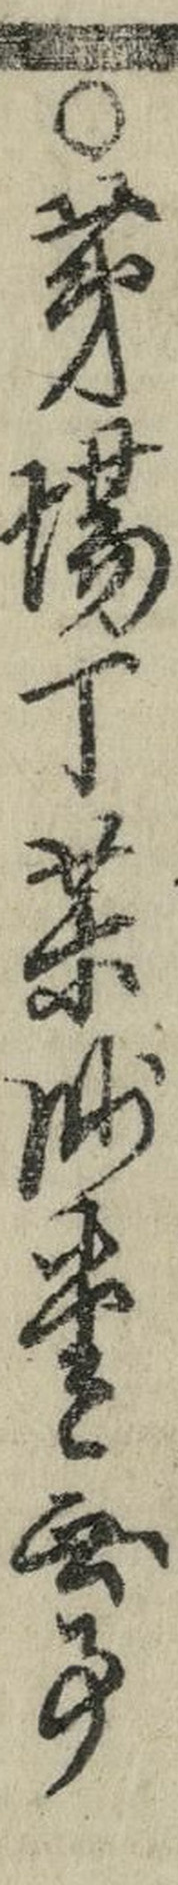○茅場丁薬師堂無事
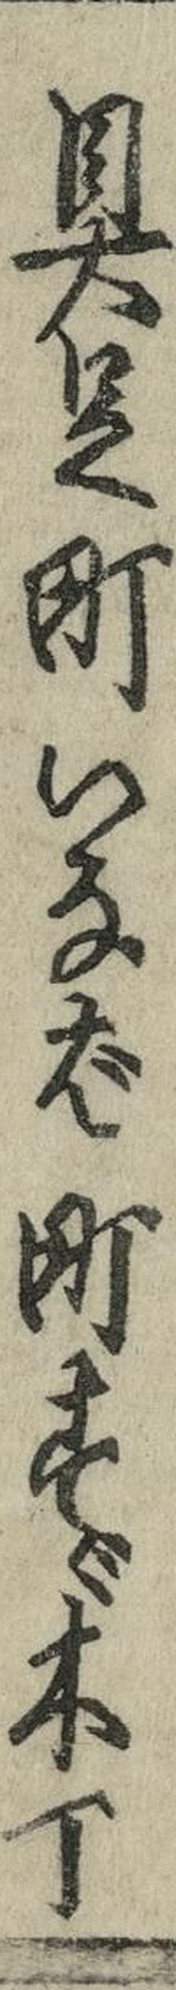具足町いなば町すゞ木丁
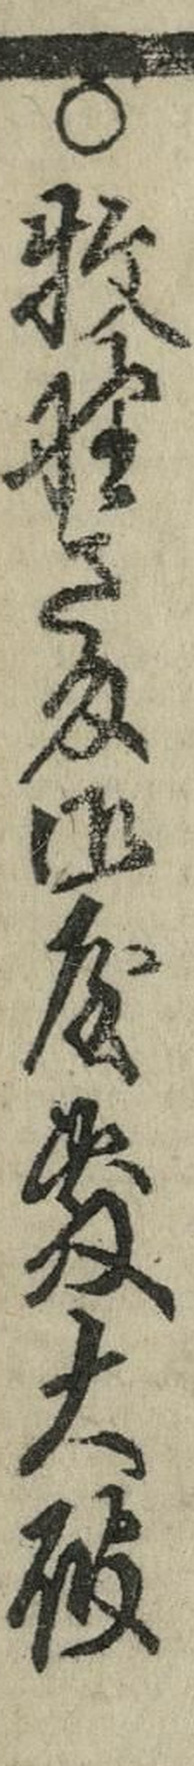○牧野さま御屋敷大破
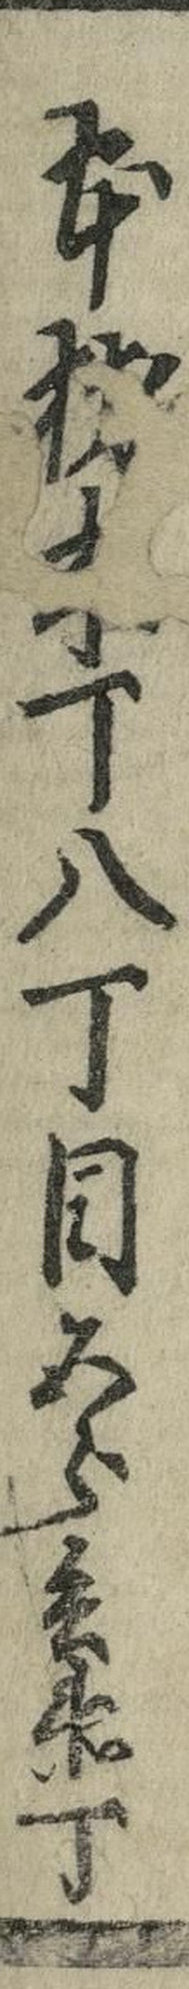本材木丁八丁目五郎兵衛丁
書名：江戸　大地震末代噺の種　全
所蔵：東京大学地震研究所図書室 Earthquake Research Institute Library, The University of Tokyo, JAPAN
